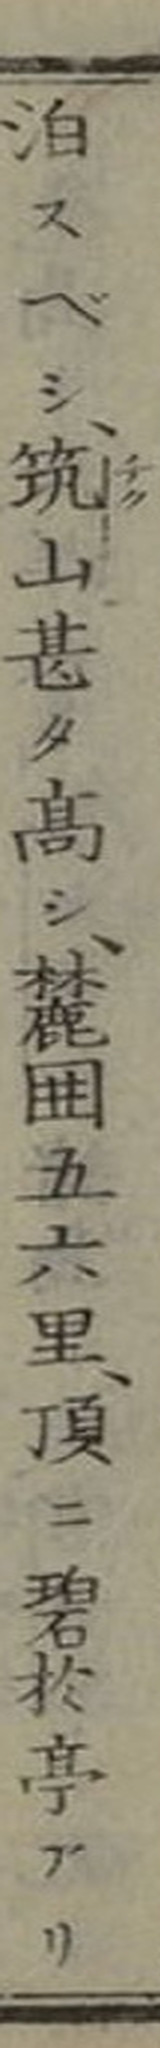泊スベシ、筑山甚タ高シ、麓囲五六里、頂ニ碧於亭アリ
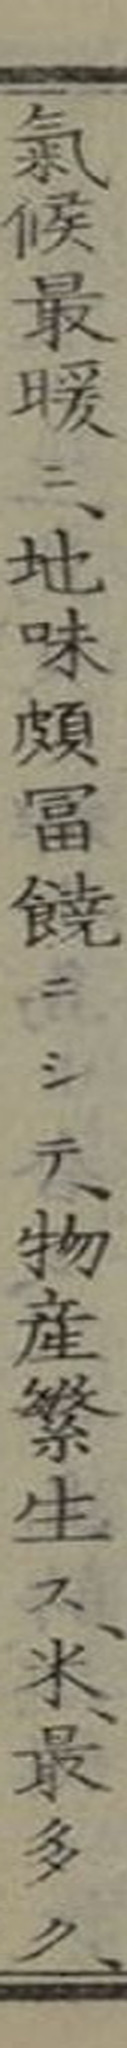気候最暖二、地味頗富饒ニシテ、物産繁生ス、米、最多ク、
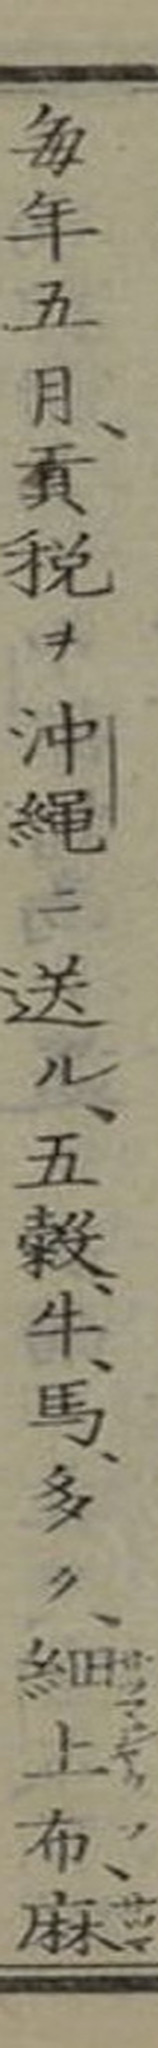毎年五月、貢税ヲ沖縄ニ送ル、五穀、牛、馬、多ク、細上布、麻
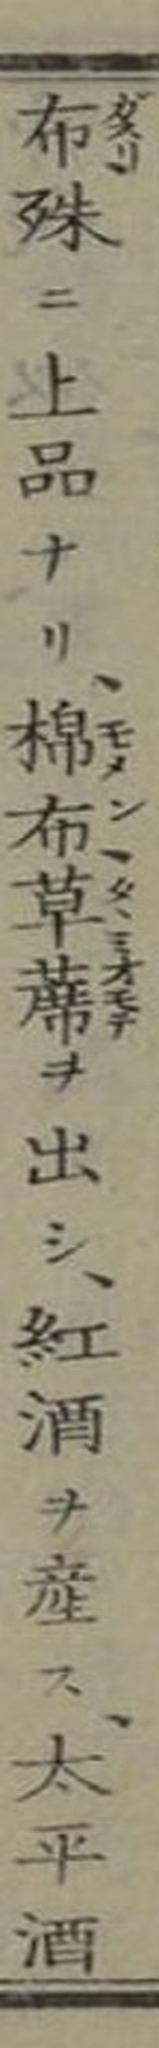布殊ニ上品ナリ、棉布、草蓆ヲ出シ、紅酒ヲ産ス、太平酒
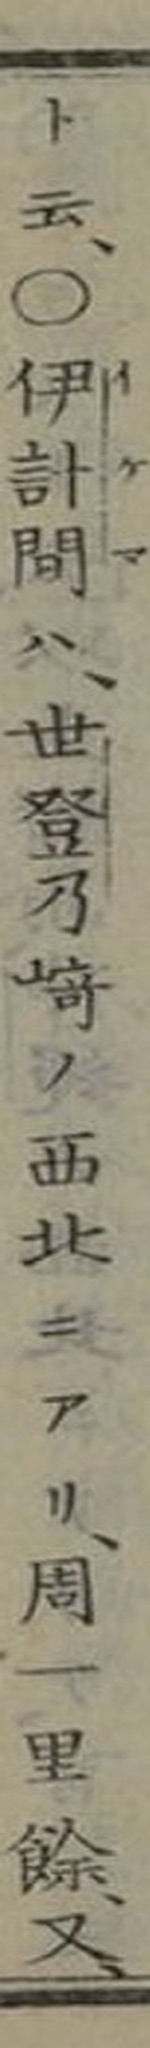ト云、○伊計間ハ、世登乃崎ノ西北ニアリ、周一里余、又、
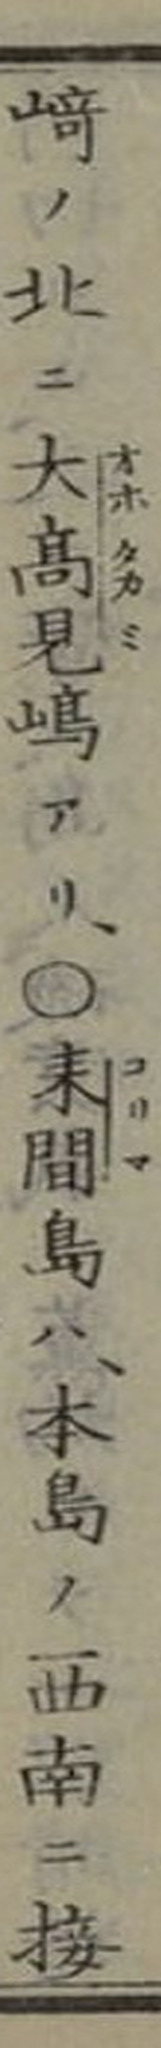崎ノ北ニ大高見島アリ、○来間島ハ、本島ノ西南ニ接
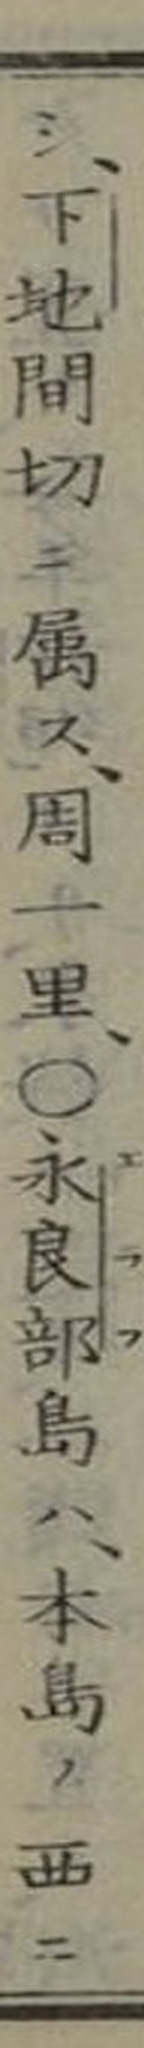シ、下地間切ニ属ス、周一里、○永良部島ハ、本島ノ西ニ
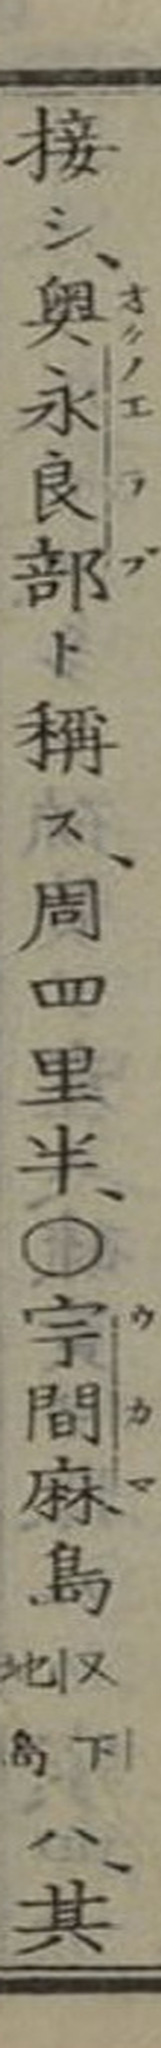接シ、奥永良部ト称ス、周四里半、○宇間麻島又下地島ハ、其
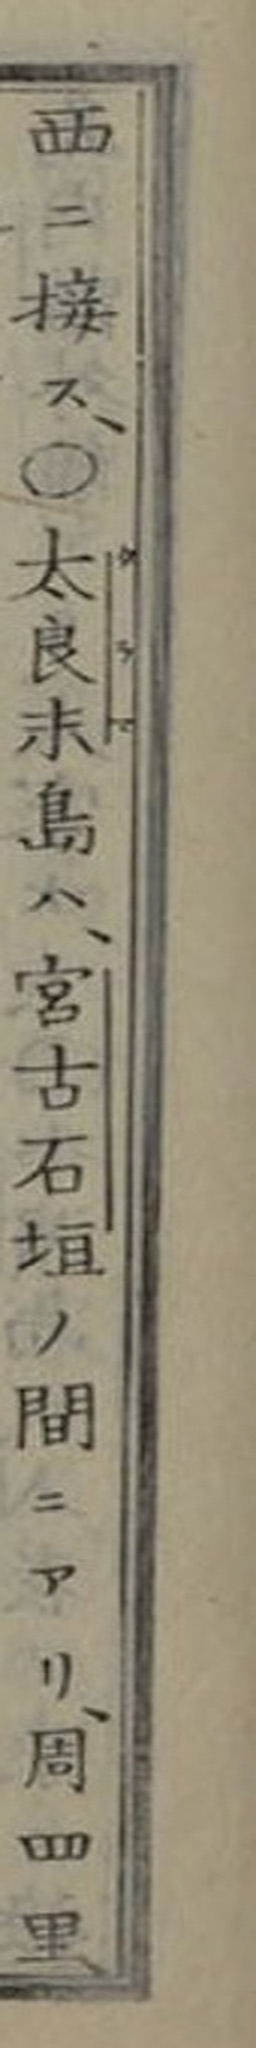西ニ接ス、○太良末島ハ、宮古石垣ノ間ニアリ、周四里、
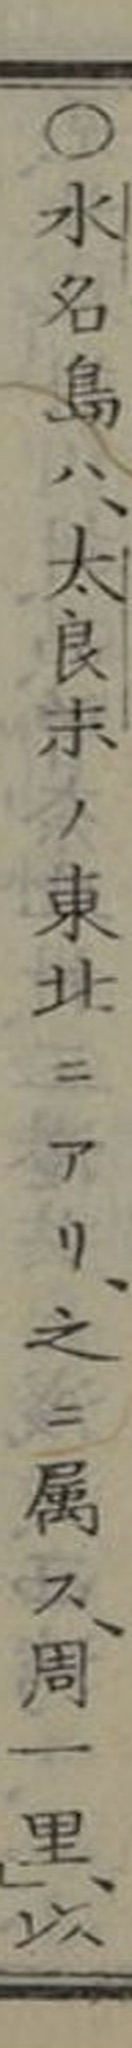○水名島ハ、太良末ノ東北ニアリ、之ニ属ス、周一里、」以
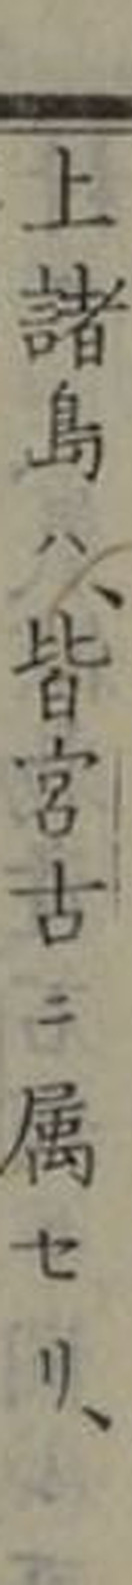上諸島ハ、皆宮古ニ属セリ、
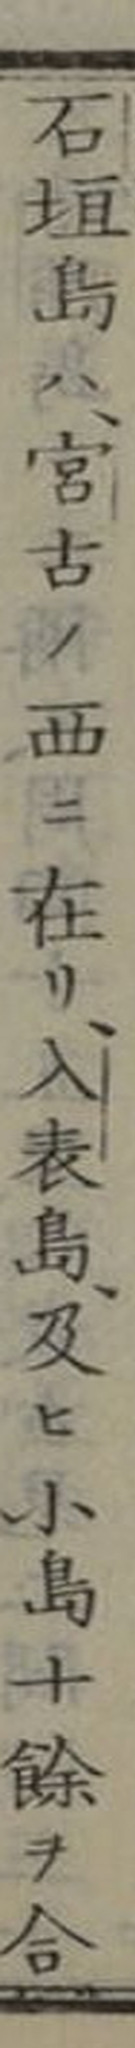石垣島ハ、宮古ノ西ニ在リ、入表島、及ヒ小島十余ヲ合
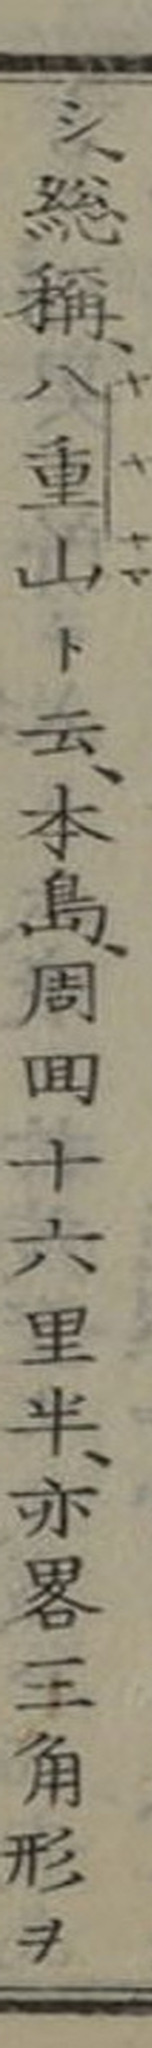シ、総称、八重山ト云、本島、周回十六里半、亦略三角形ヲ
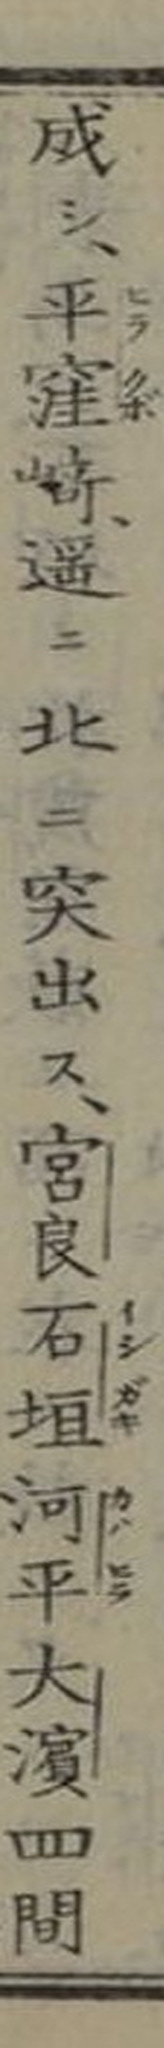成シ、平窪崎、遥ニ北ニ突出ス、宮良石垣河平大浜四間
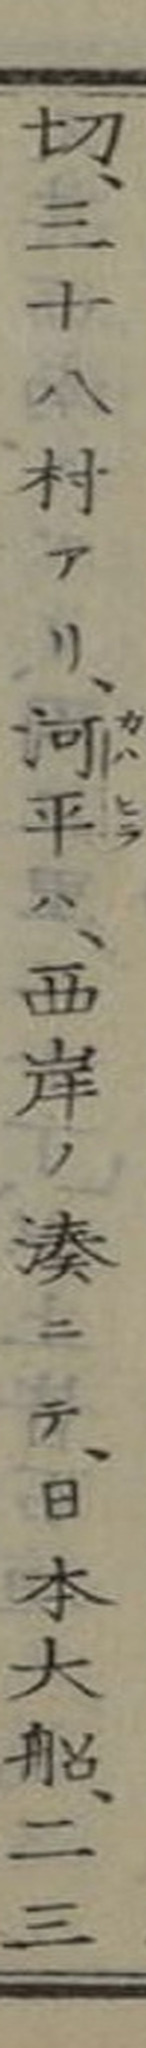切、三十八村アリ、河平ハ、西岸ノ湊ニテ、日本大船、二三
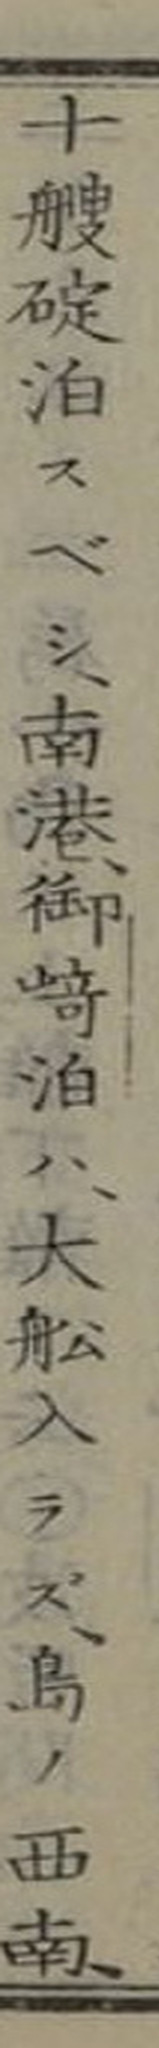十艘碇泊スベシ、南港、御崎泊ハ、大船入ラズ、島ノ西南、
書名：琉球新誌 図附 上
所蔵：University of the Ryukyus Library
